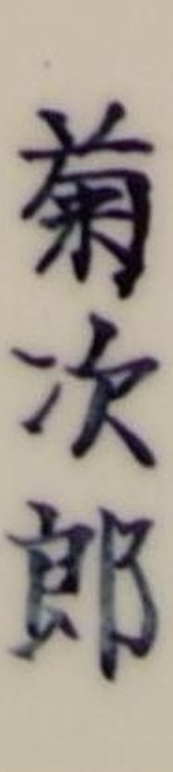菊次郎
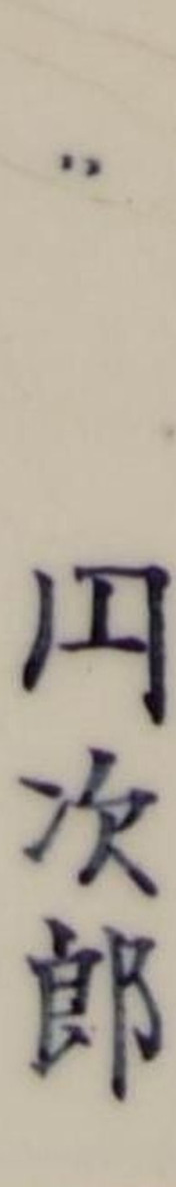円次郎
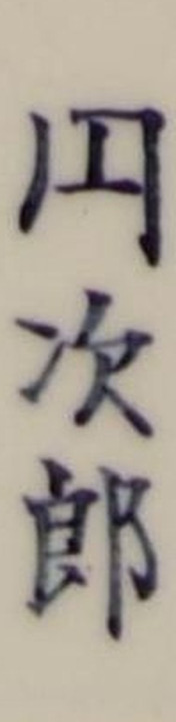円次郎
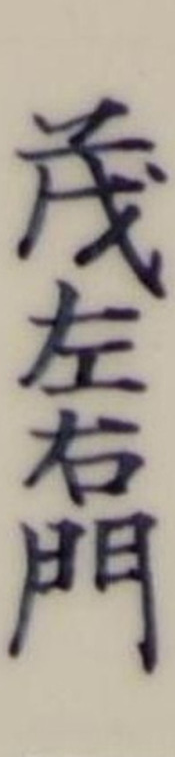茂左衛門
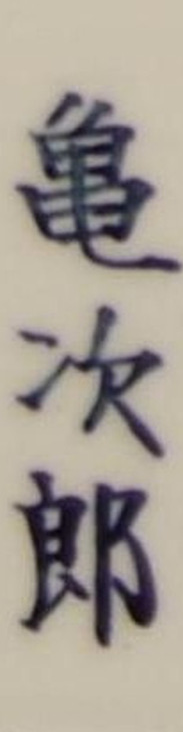亀次郎

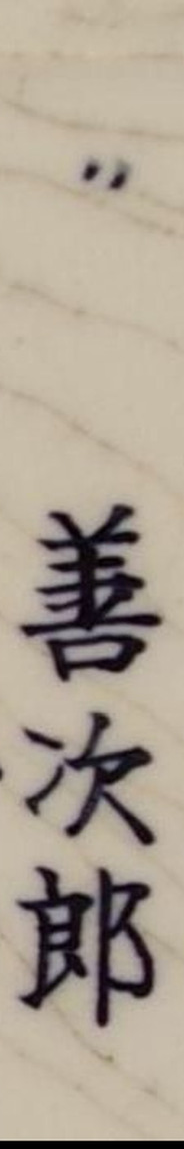善次郎
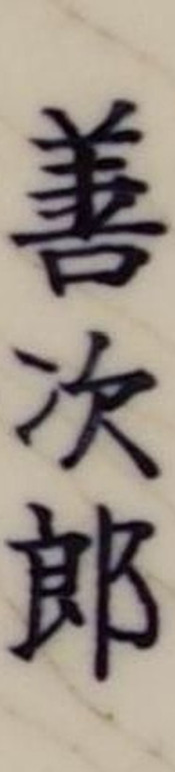善次郎
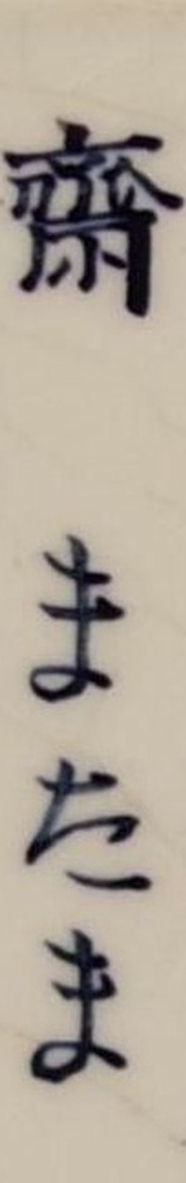斎またま
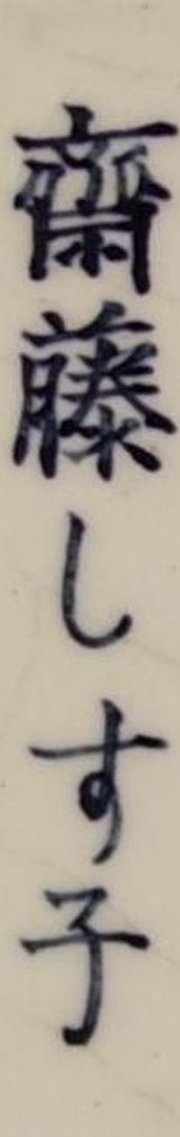斎藤しす子
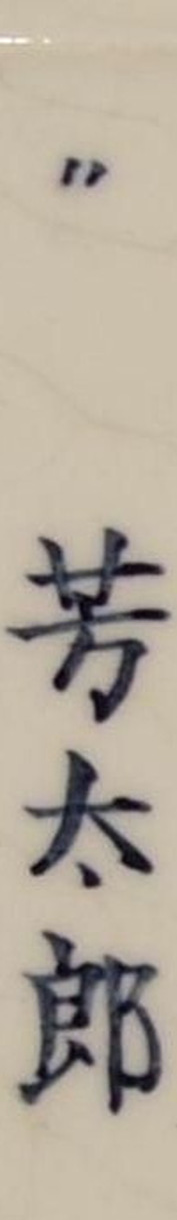芳太郎
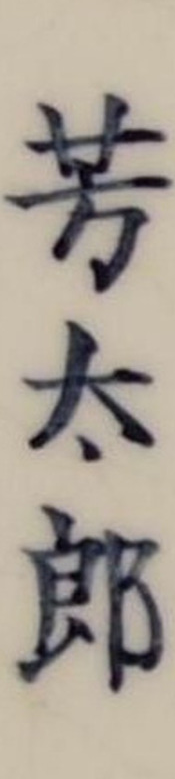芳太郎
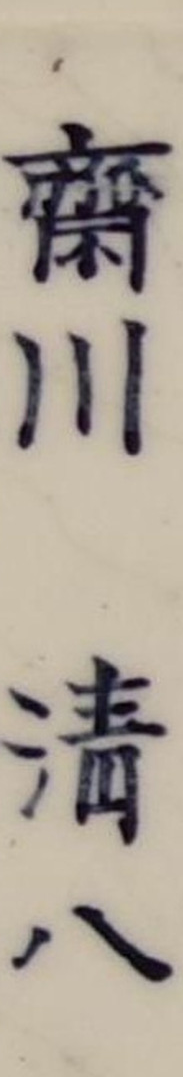齋川清八

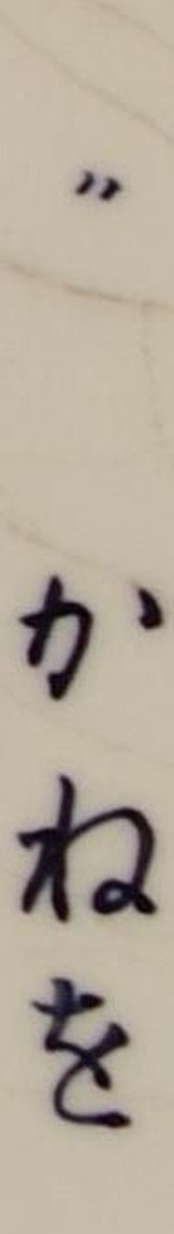かねを
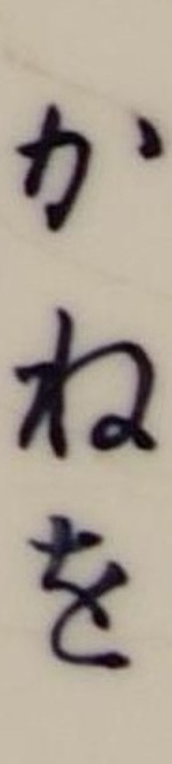かねを
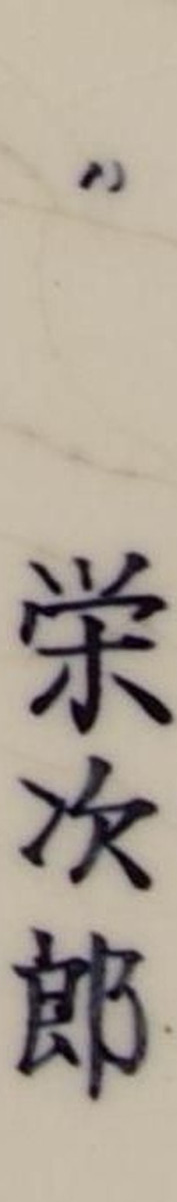栄次郎
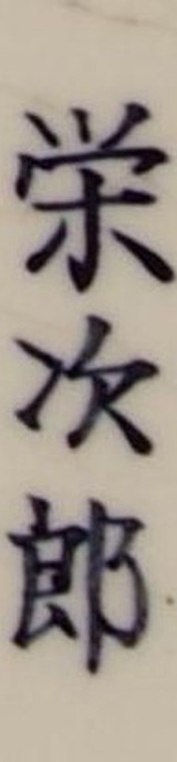栄次郎
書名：E~L
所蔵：高野山金剛峯寺
